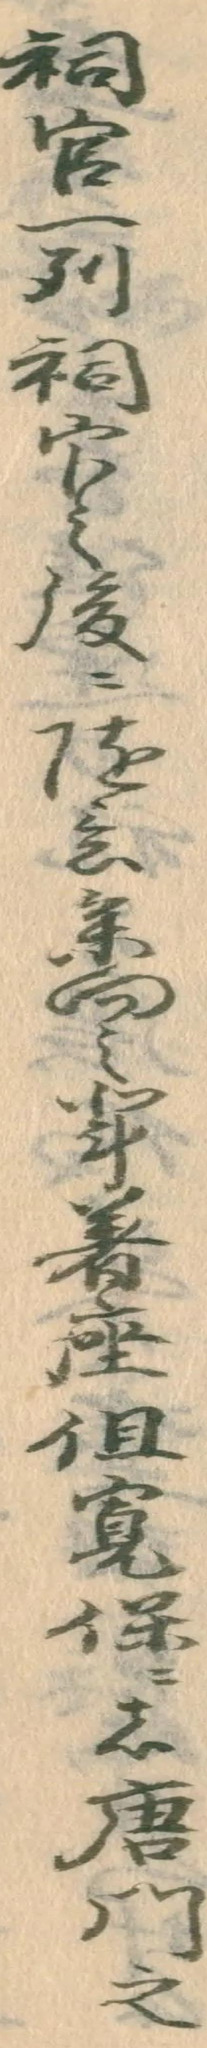祠官一列祠官之後ニ随意参向之輩着座但寛保ニは唐門之
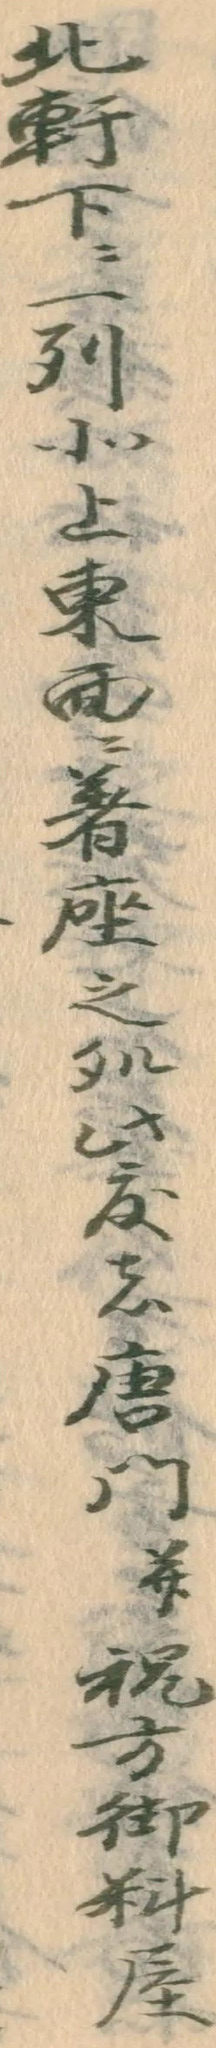北軒下ニ一列北上東面ニ着座之処此度は唐門并祝方御料屋
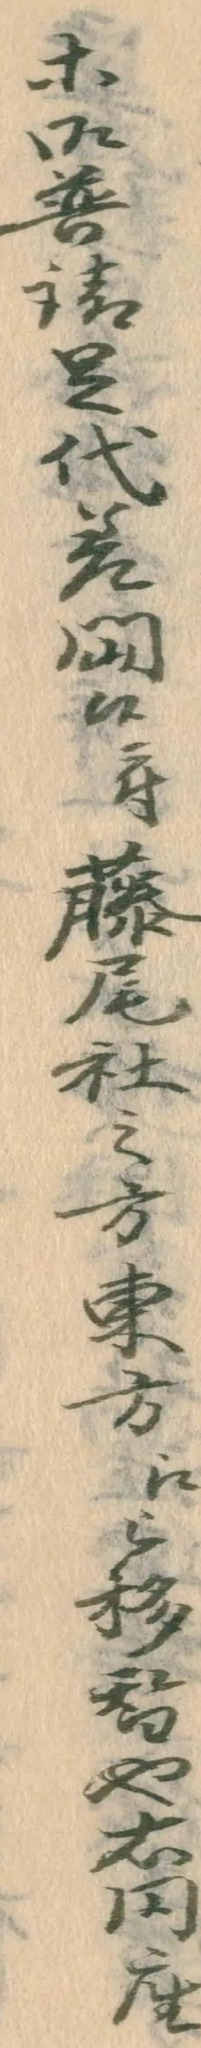等御普請足代差閊候ニ付藤尾社之方東方江被移替也右円座
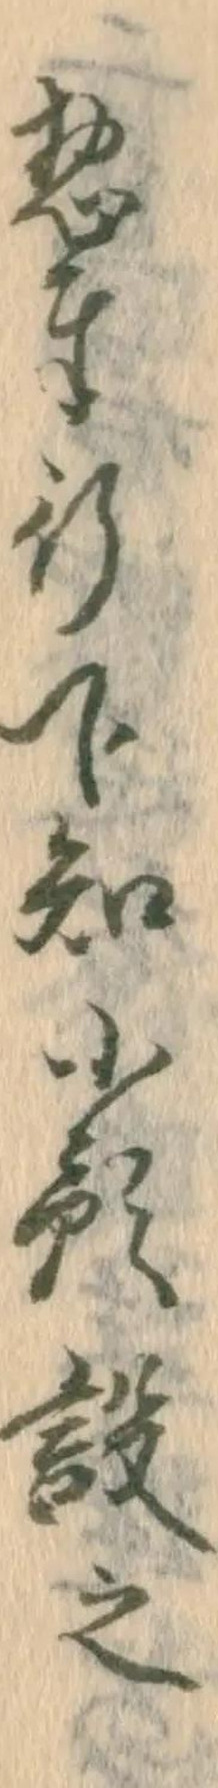惣奉行下知小預設之
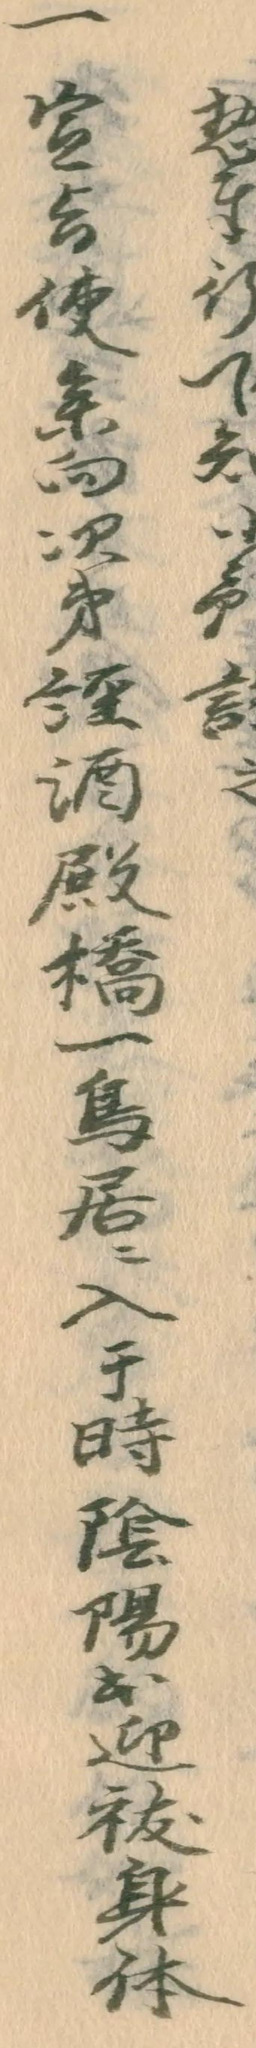一宣旨使参向次第経酒殿橋一鳥居ニ入于時陰陽出迎祓身体
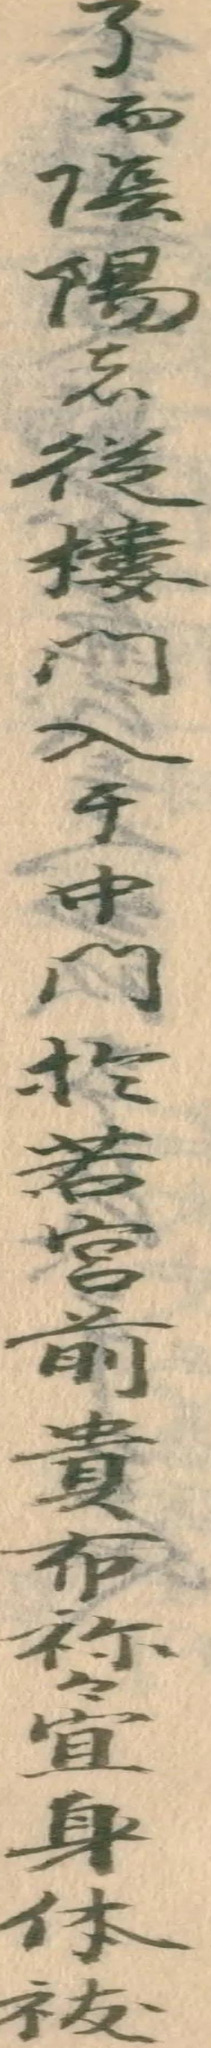了而陰陽は従楼門入于中門於若宮前貴布祢々宜身体祓
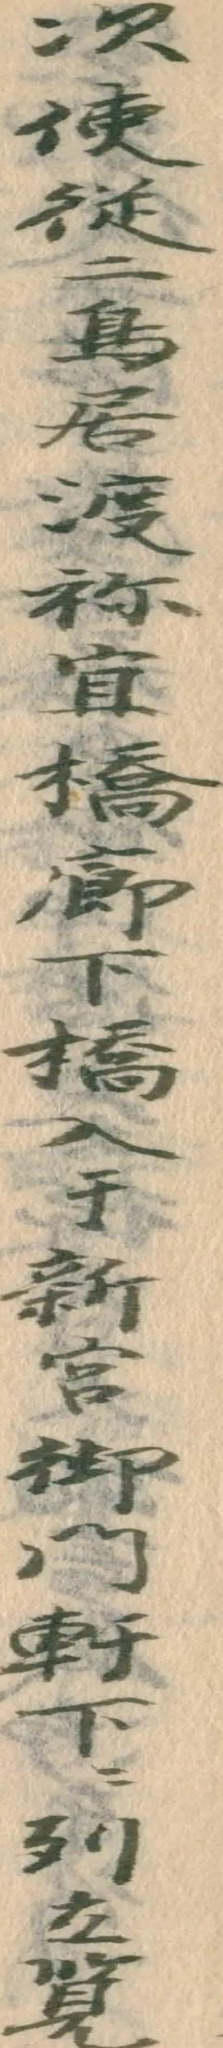次使従二鳥居渡祢宜橋廊下橋入于新宮御門軒下ニ列立覧
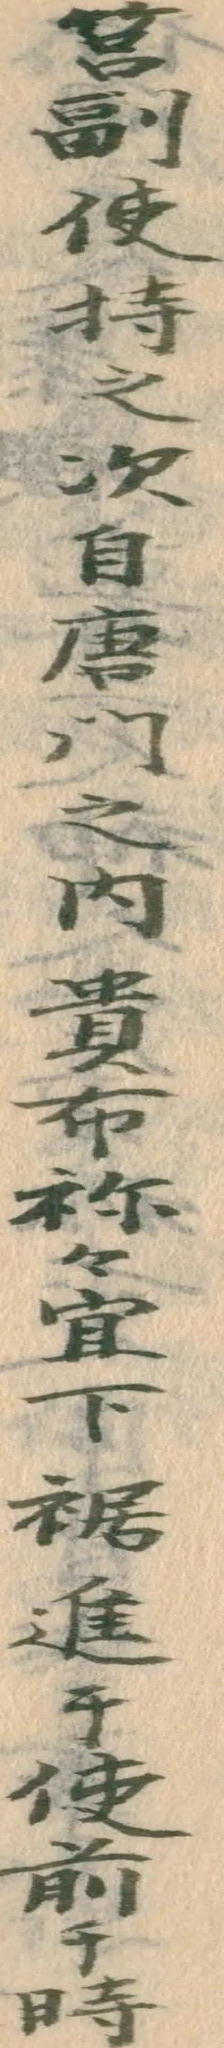筥副使持之次自唐門之内貴布祢々宜下裾進于使前于時
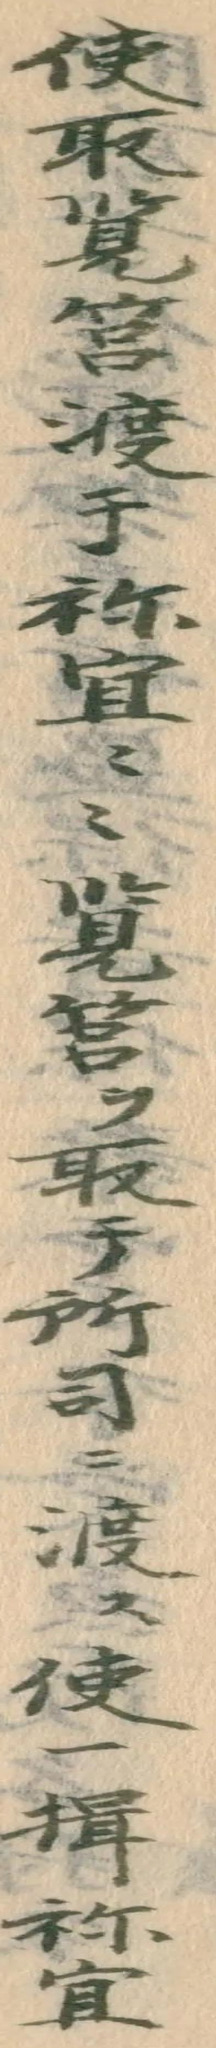使取覧筥渡于祢宜々々覧筥ヲ取テ所司ニ渡ス使一揖祢宜
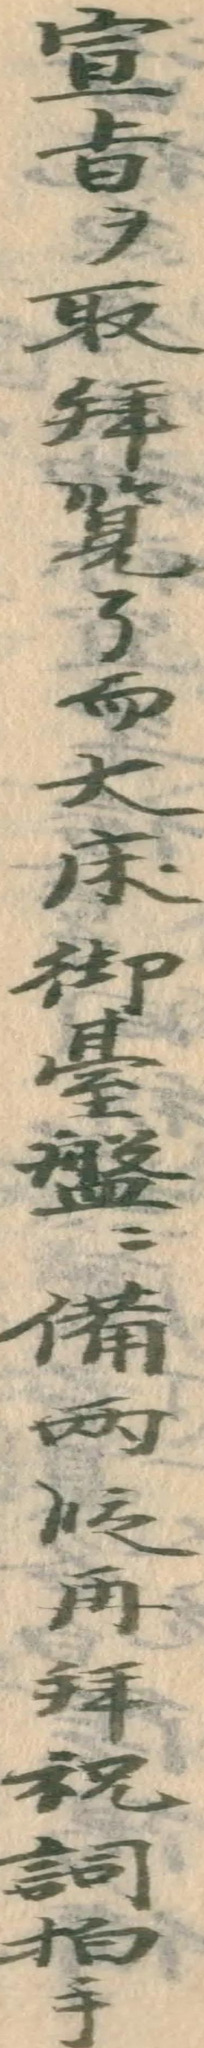宣旨ヲ取拝覧了而大床御台盤ニ備両段再拝祝詞拍手
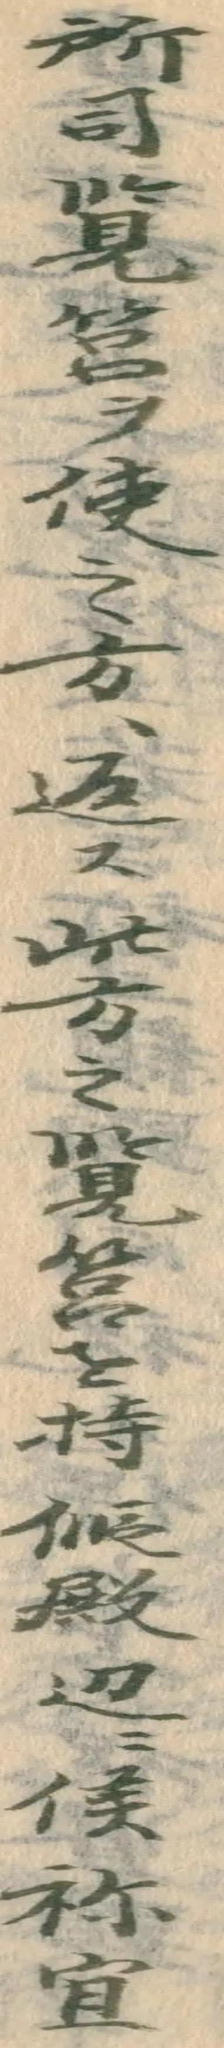所司覧筥ヲ使之方へ返ス此方之覧筥を持仮殿辺ニ侯祢宜
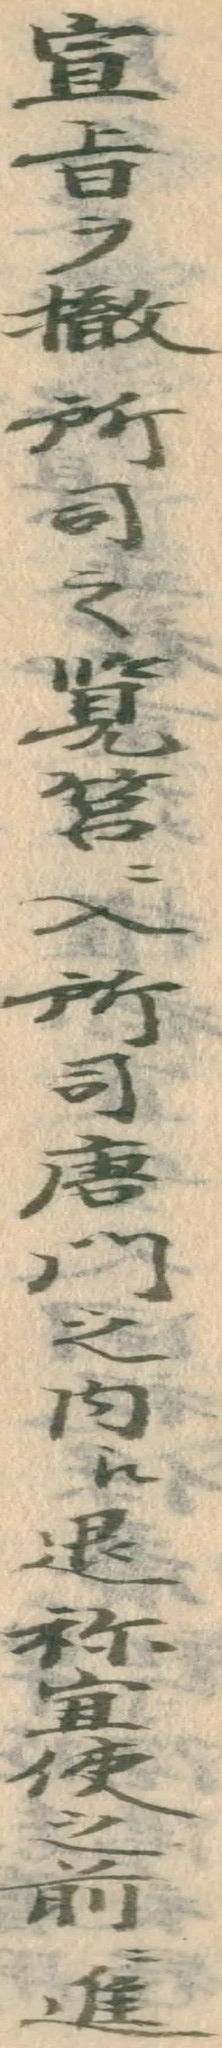宣旨ヲ撤所司之覧筥ニ入所司唐門之内江退祢宜使之前ニ進
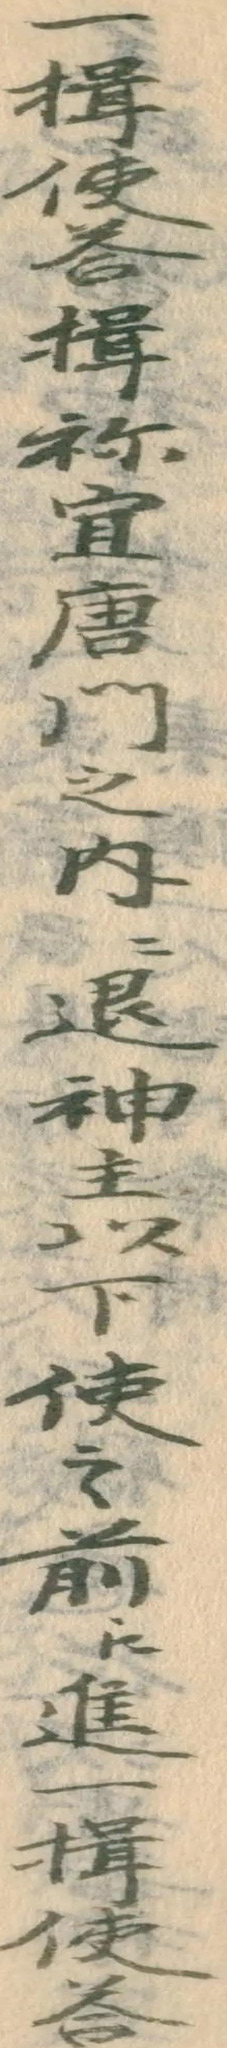一揖使答揖祢宜唐門之内ニ退神主以下使之前江進一揖使答
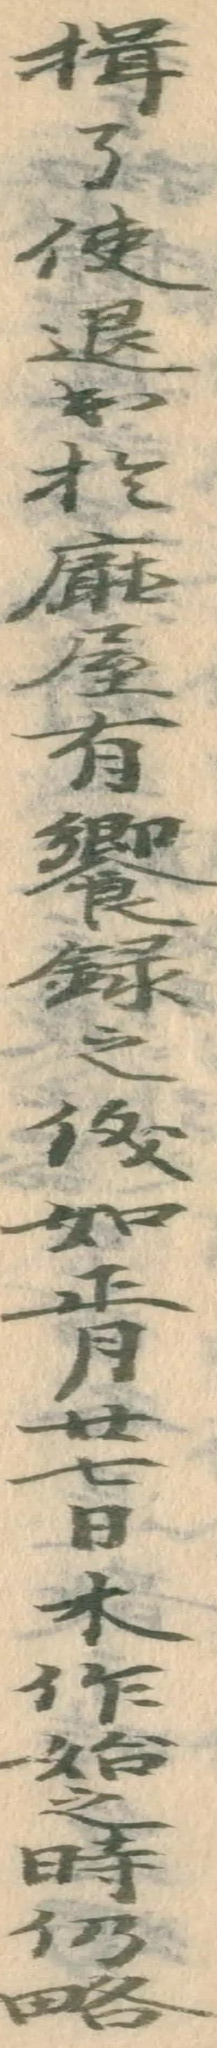揖了使退出於庁屋有饗録之儀如正月廿七日木作始之時仍略
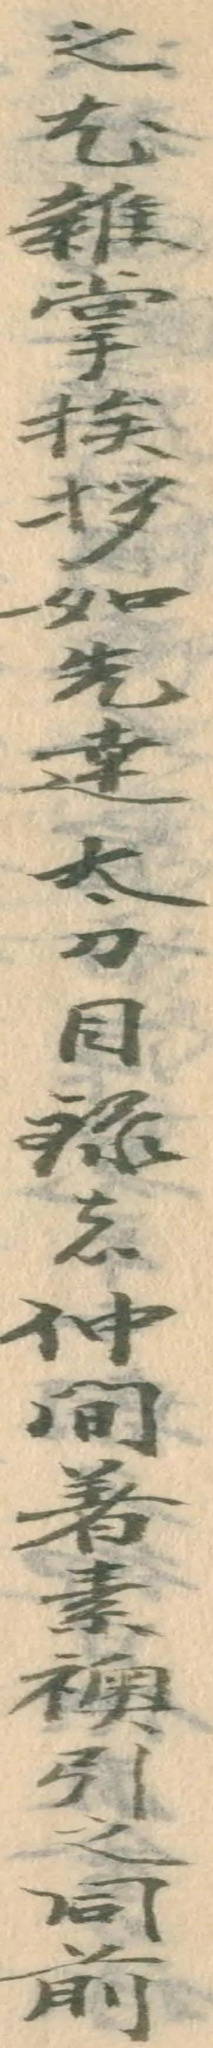之尤雑掌挨拶如先達太刀目録は仲間着素襖引之同前
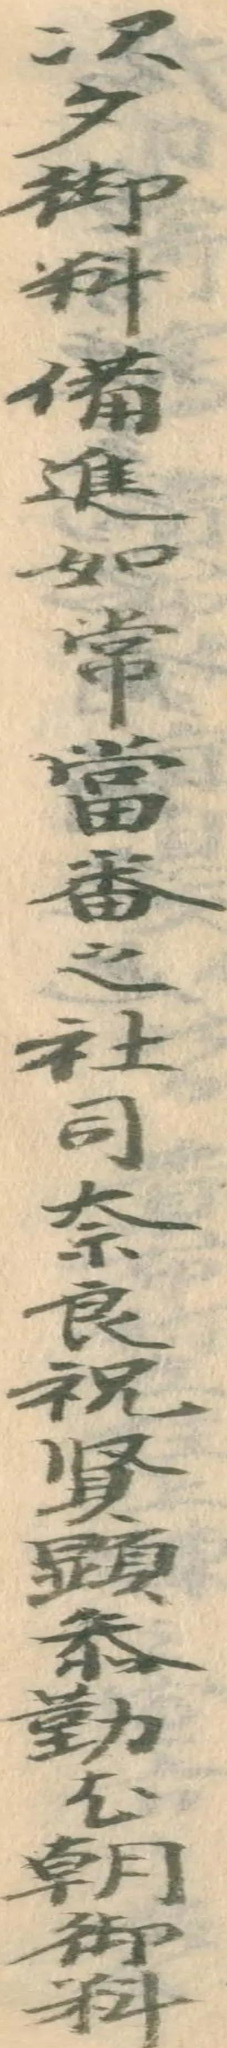次夕御料備進如常当番之社司奈良祝賢顕参勤尤朝御料
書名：賀茂社記録. 第17冊
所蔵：国立国会図書館 National Diet Library, JAPAN
